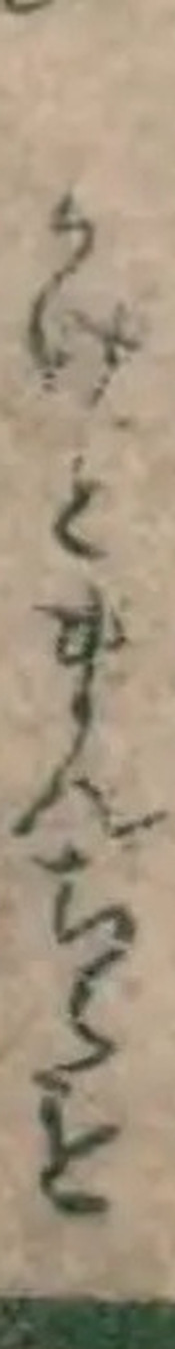かけまんちうを
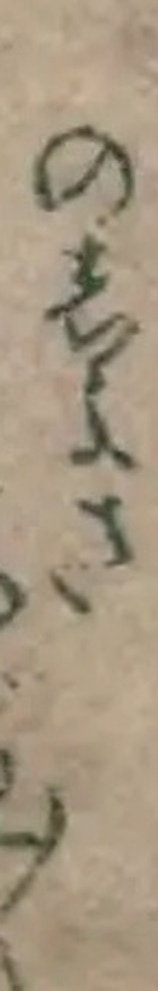のしよさ
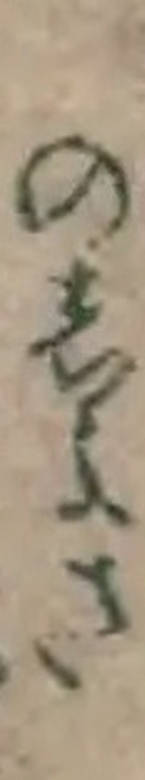のしよさ
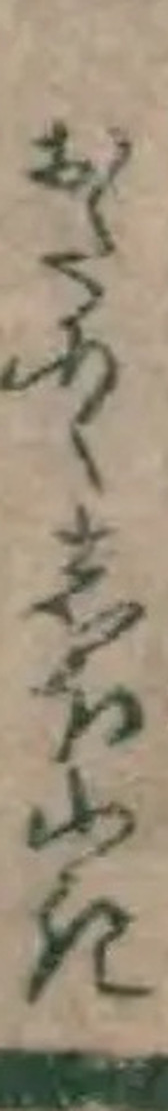おたふくしほふき
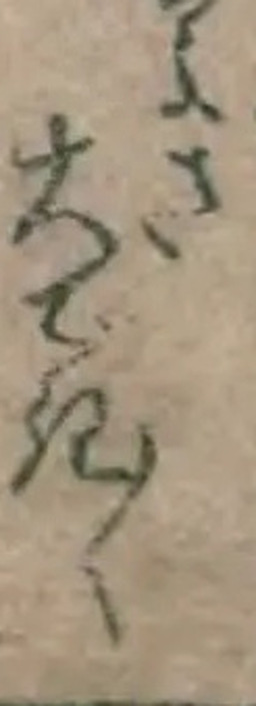大でき〳〵
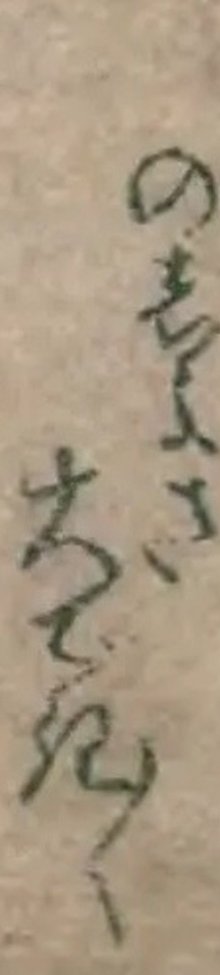大でき〳〵
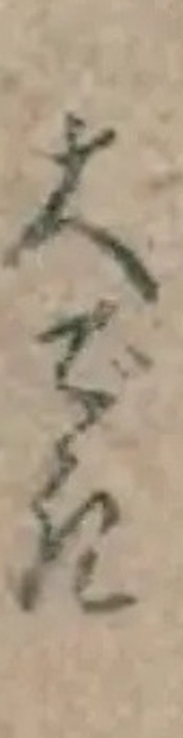大でき
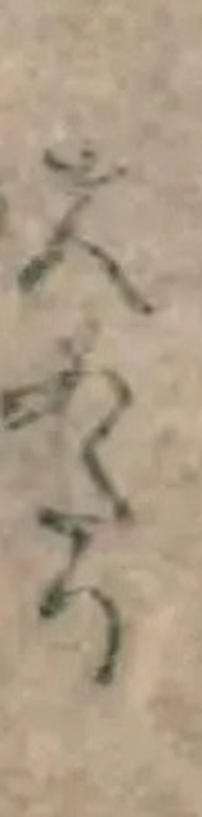大あたり
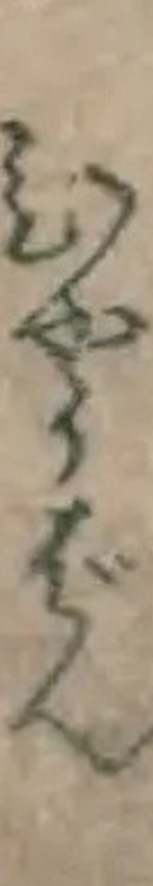ひやうばん

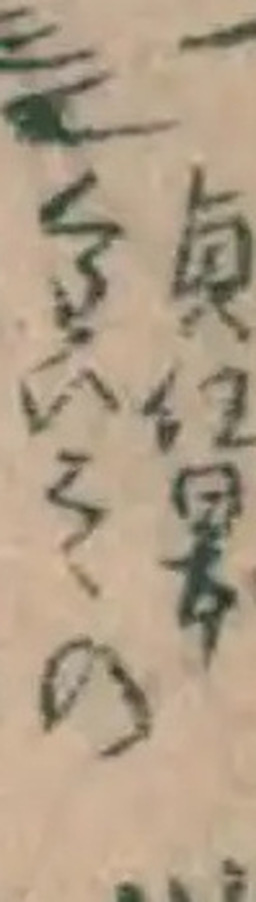くわいこくの
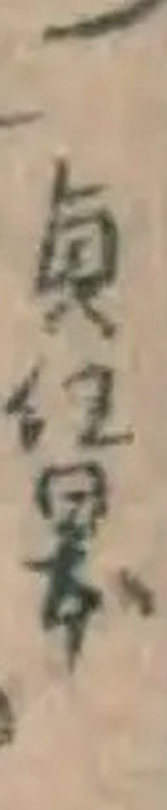貞任日本
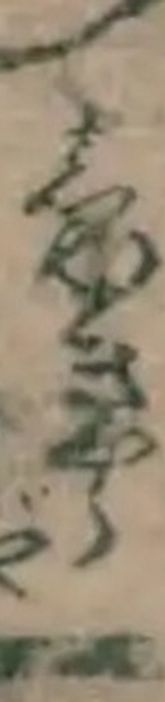しゆきやう
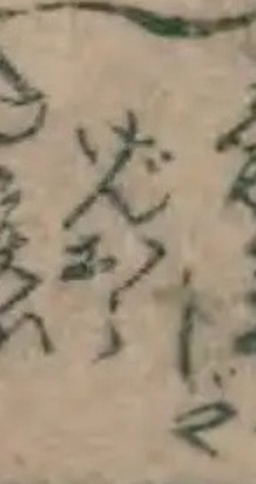げんおう
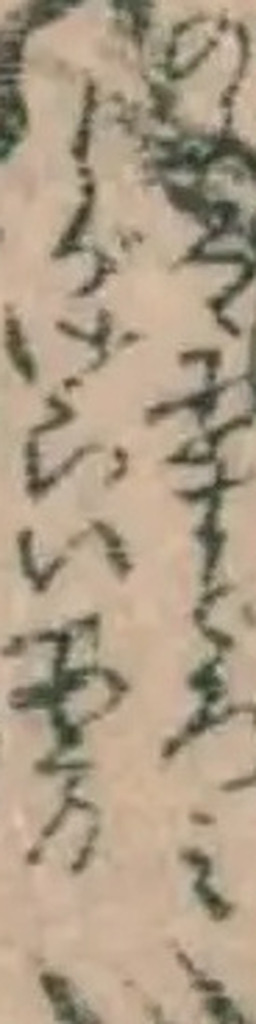しがけらい安方
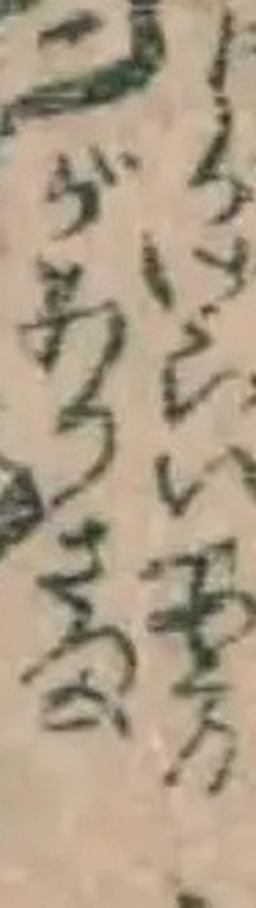がありさま
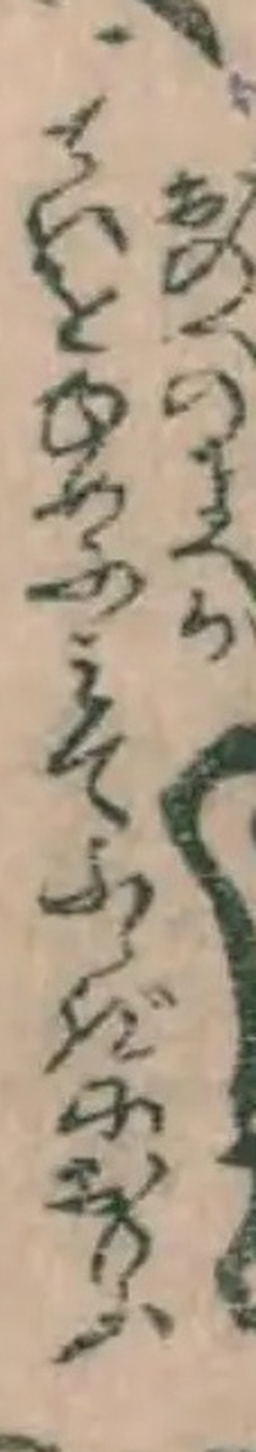ていをゆめにみてふしぎにおもふ
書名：伊達錦對将 : 森田座
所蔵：国立国会図書館 National Diet Library, JAPAN
